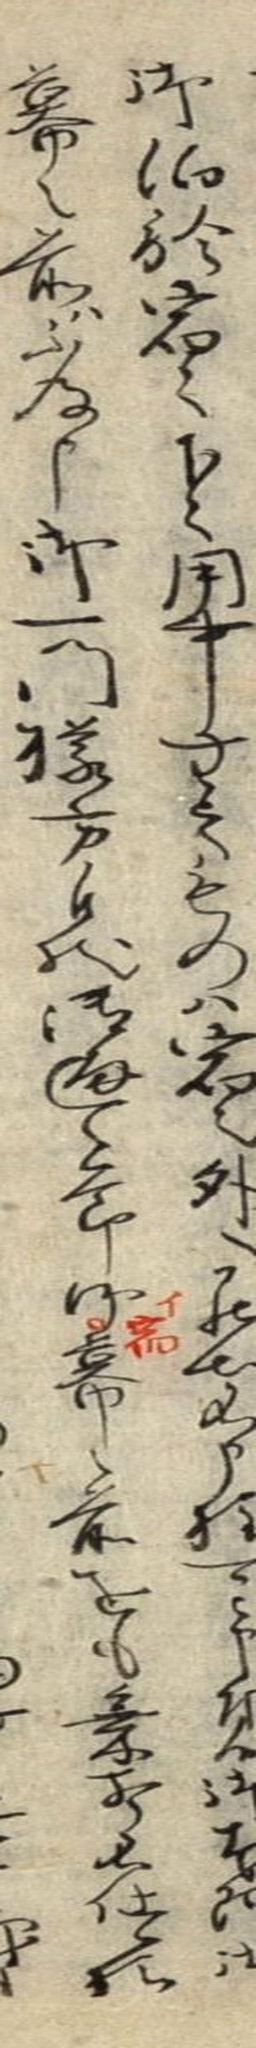幕之前は不及申御一門様方自然御通之節御◦幕之前をも乗打不仕候様
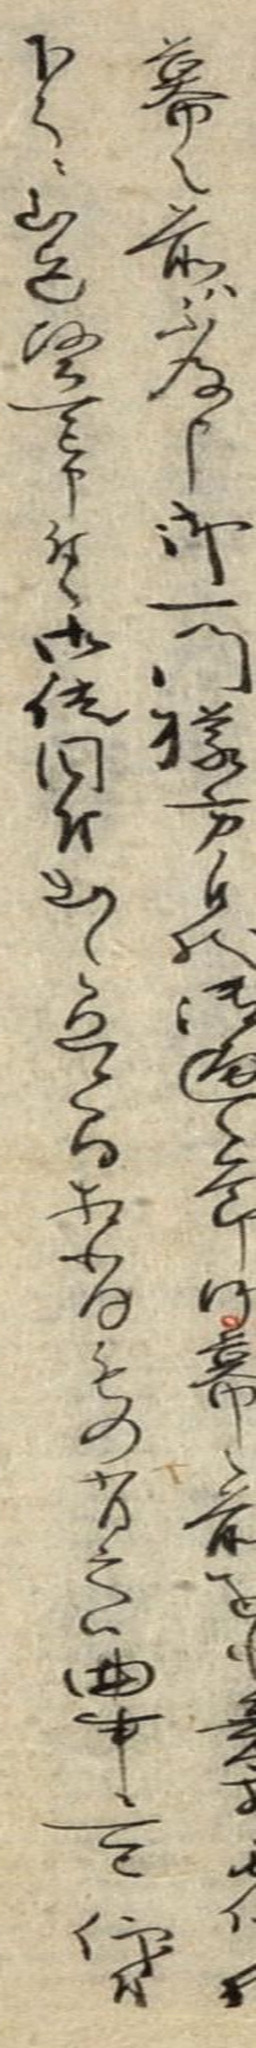下々に至迄堅可被申付候御徒目付出し置候間相背もの有之は曲事可被仰付
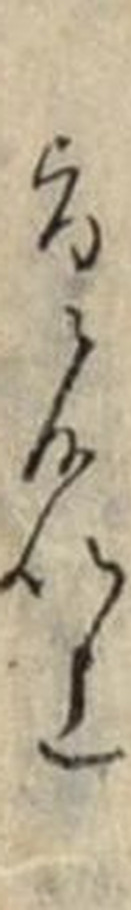旨に候以上

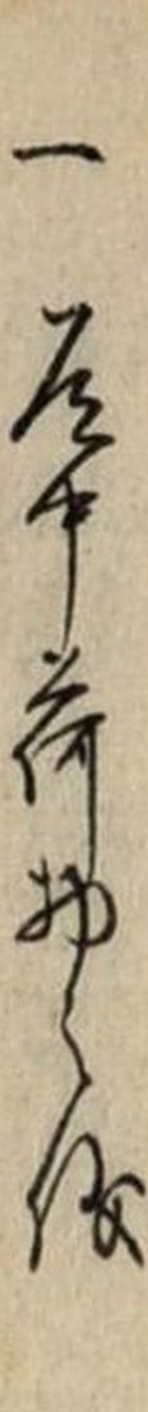一道中荷物之儀
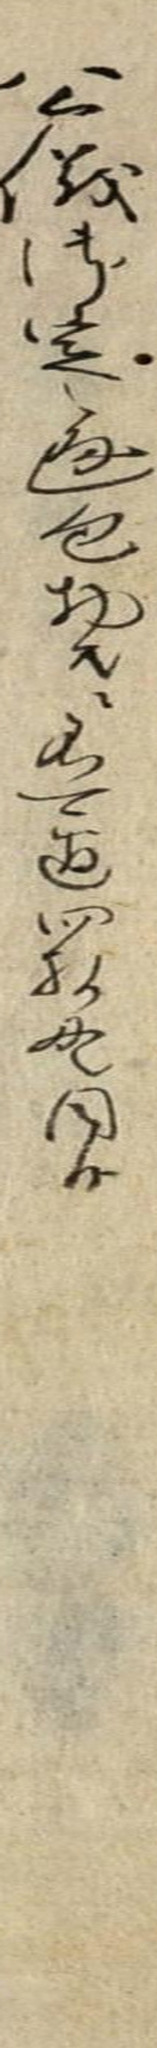公儀御定之通包物共に不可過四拾貫目候
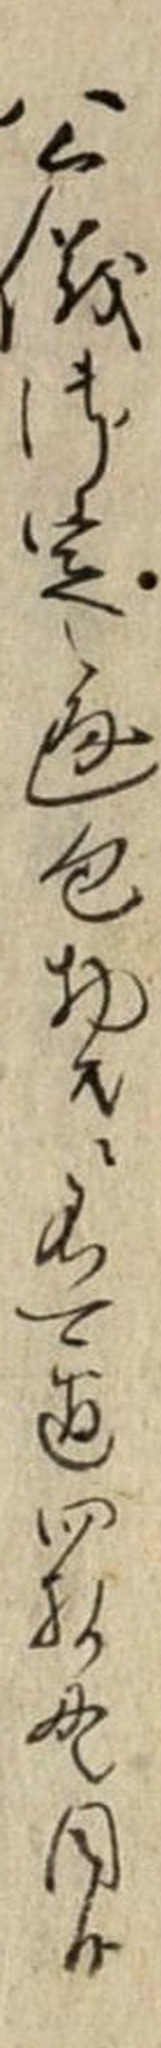公儀御定之通包物共に不可過四拾貫目候
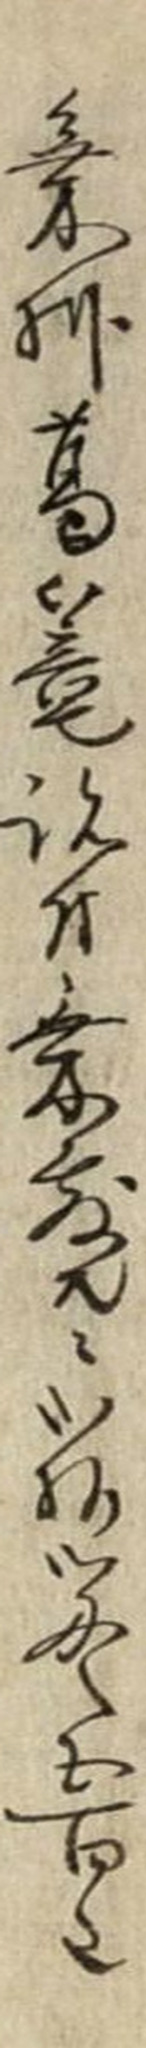一乗掛葛篭跡付乗敷共に弐拾弐貫五百匁
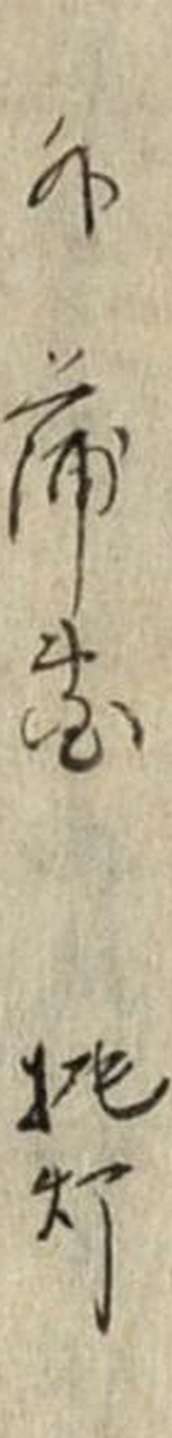外蒲団挑灯
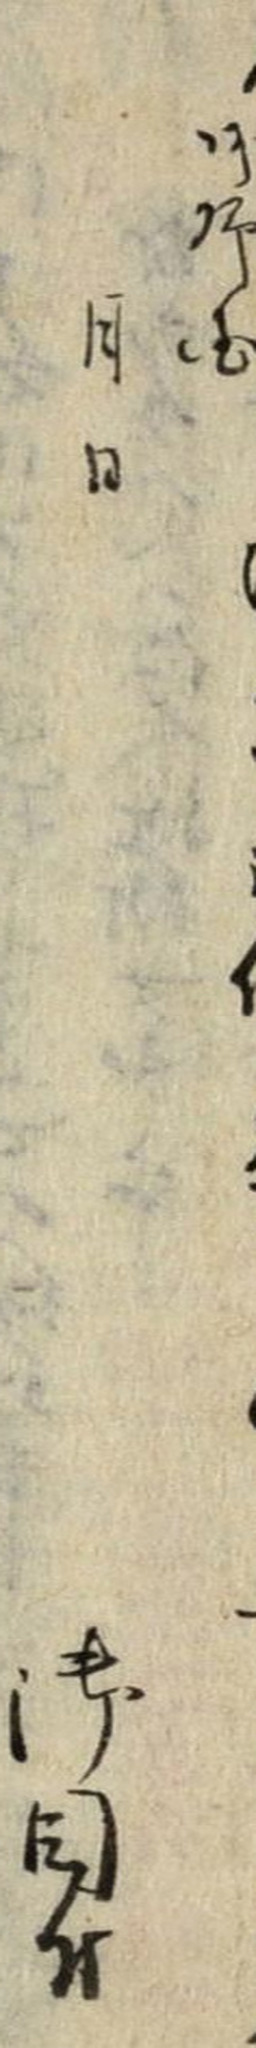月日御目付
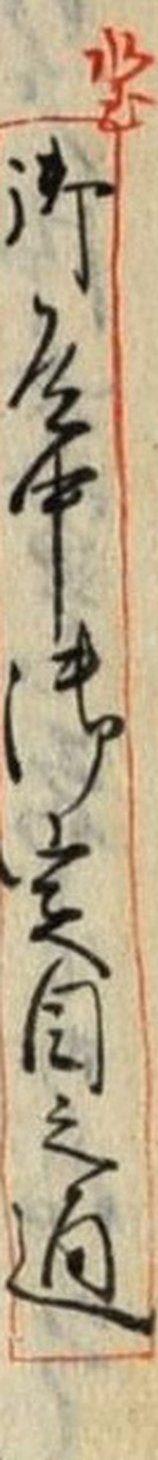御道中御定目之通
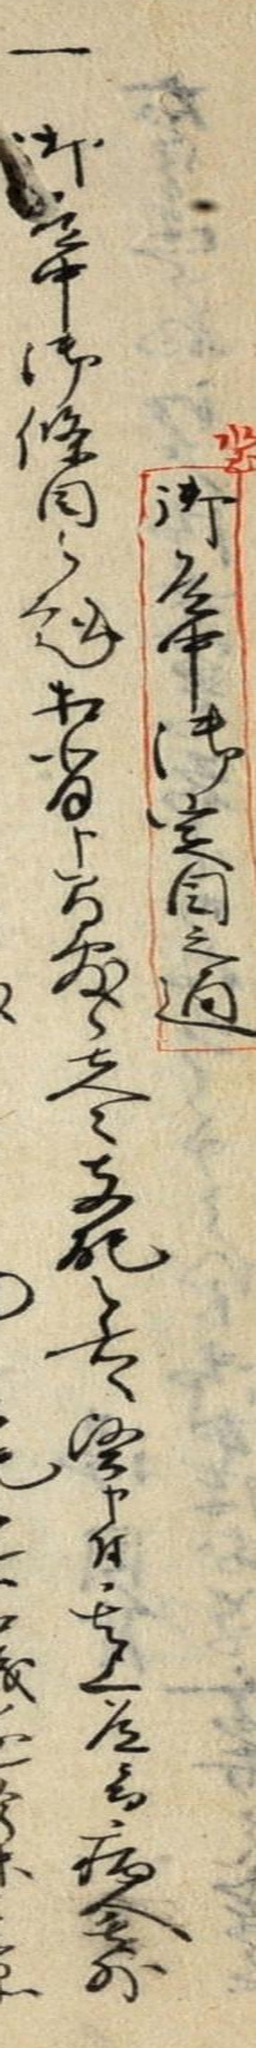一御道中御條目之趣相背申間敷候夫々支配之者へ堅申付其上道にて病人其外
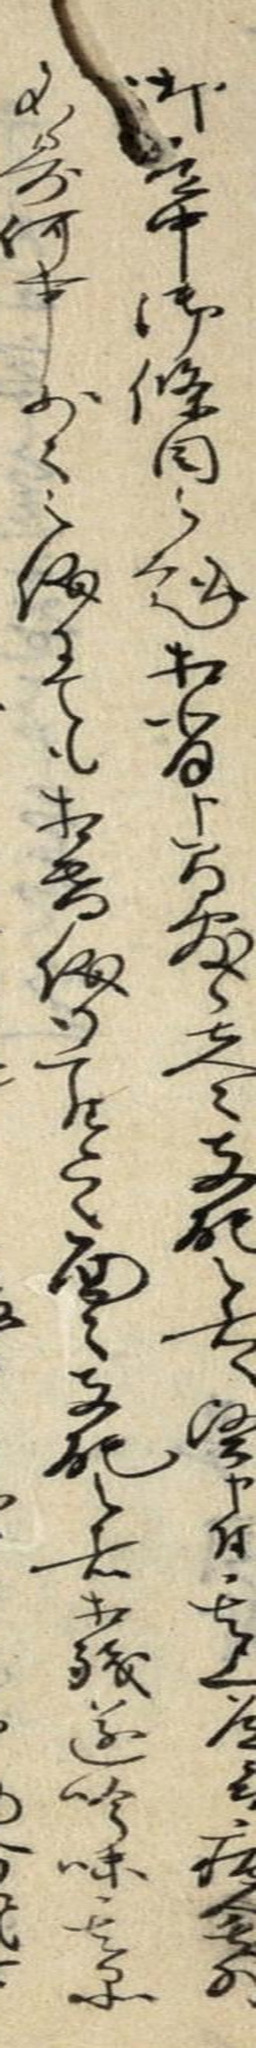不寄何事少々之儀にても相替儀御座候はゝ面々支配之者相残遂吟味其品
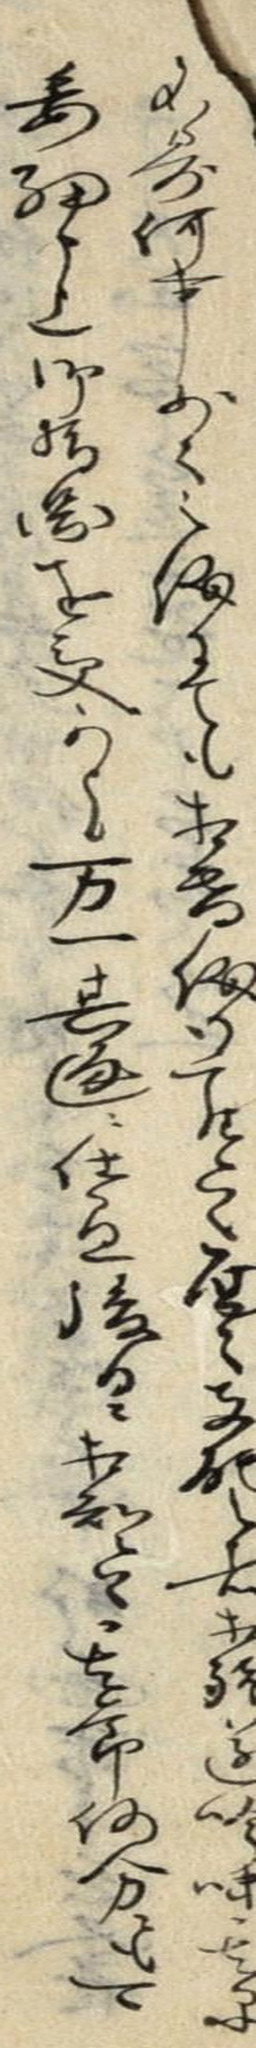委細申上御指図を受可申候万一其通に仕置後日に相知候はゝ其節何分にも可
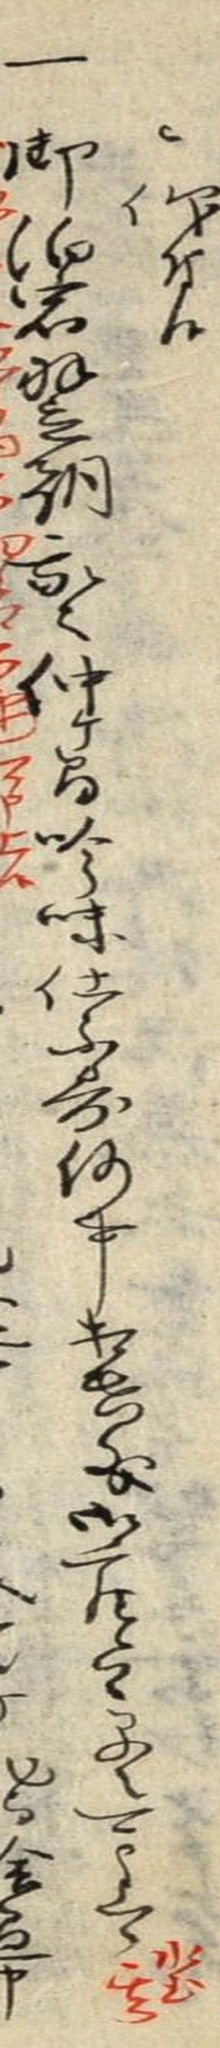一御泊宿翌朝我々仲ヶ間吟味仕不寄何事相替候義御座候はゝ早々可申上候
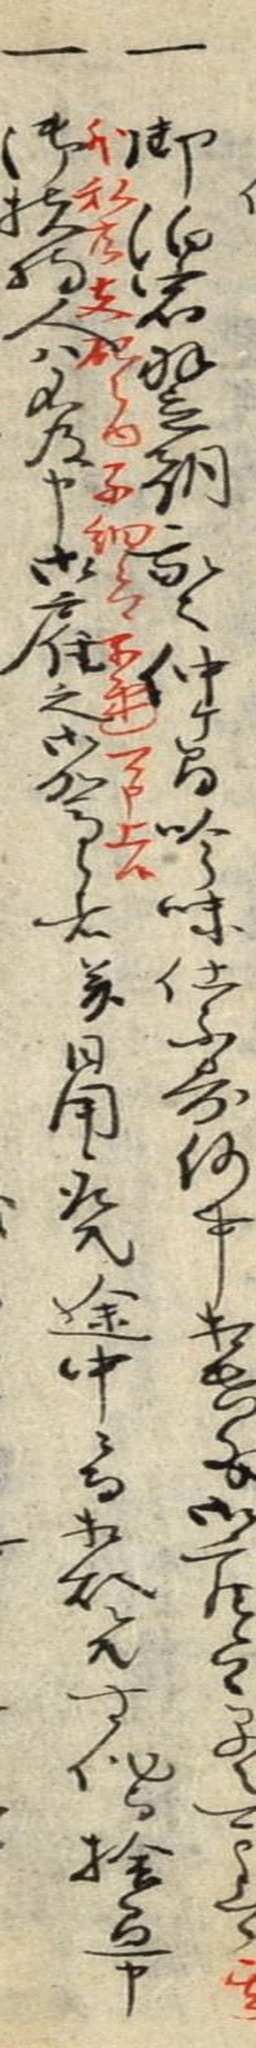一御扶持人は不及申御雇之御駕之者并日用取共途中にて相煩候共無作と捨置申
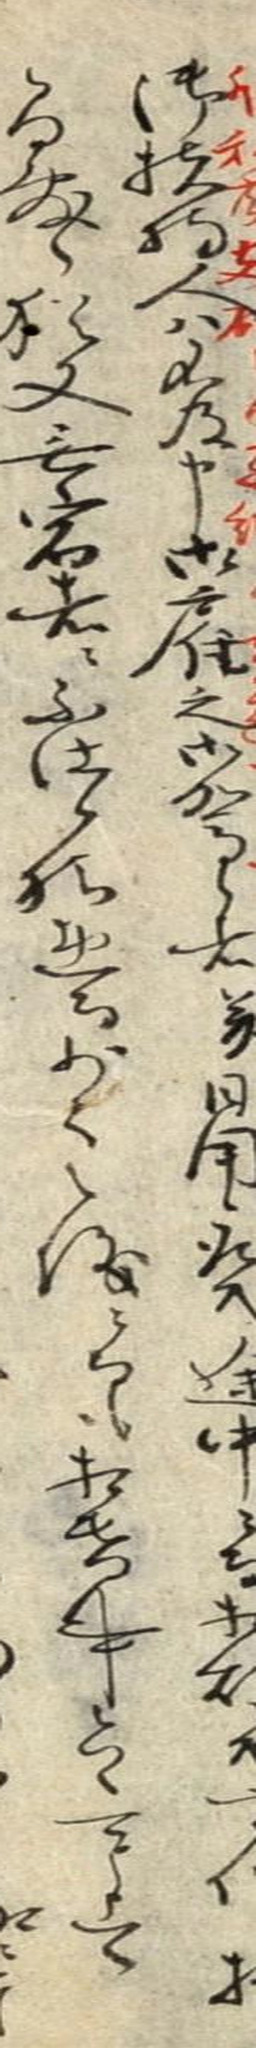間敷候猶又無宿者に不仕候様惣て少々之儀にても相替事候はゝ可申上候
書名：三都并道中之部
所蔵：福井県文書館 Fukui Prefectural Archives
